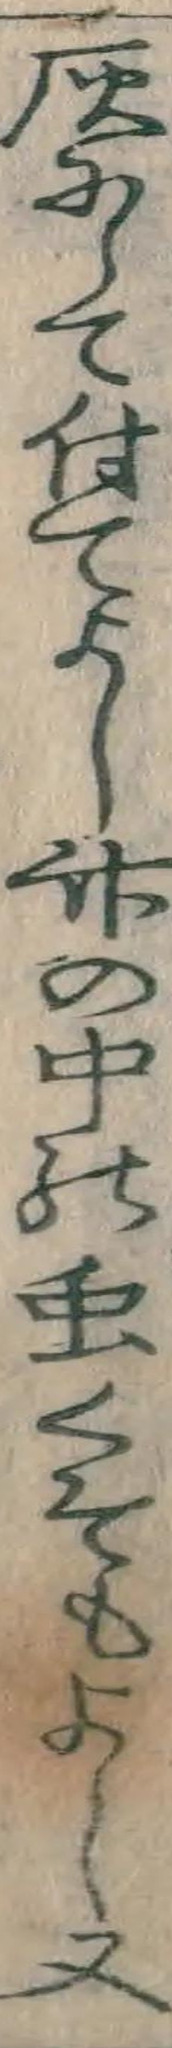灰にして付てよし竹の中の虫くそもよし又
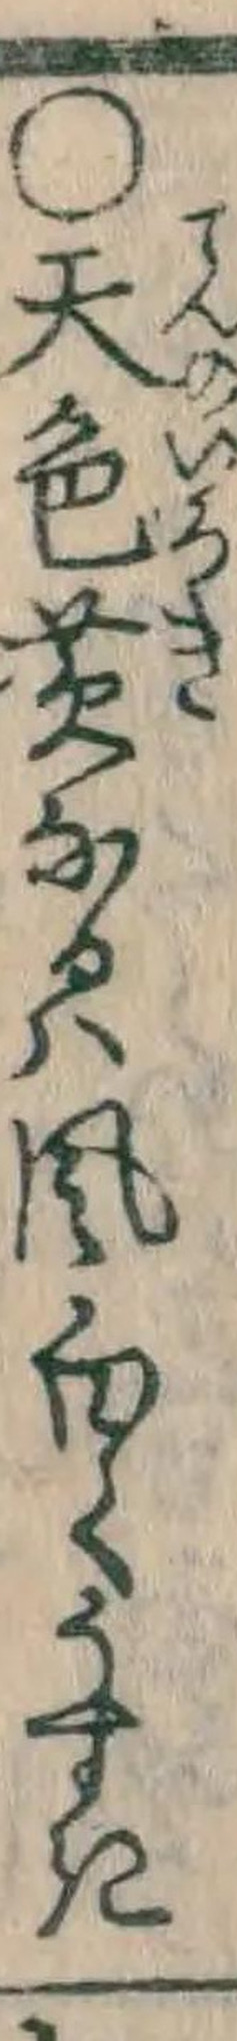○天色黄なるは風白くうすき
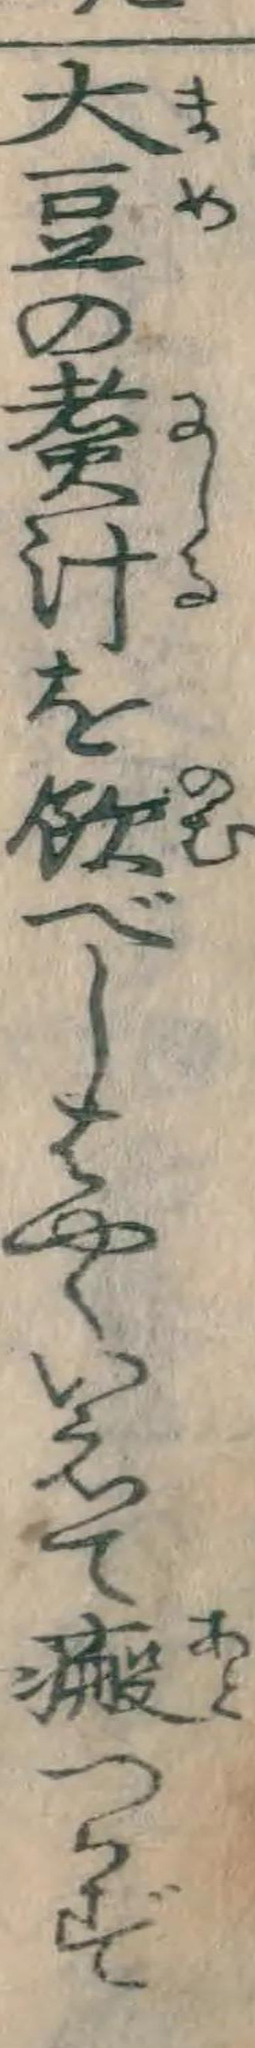大豆の煮汁を飲べしはやくいえて瘢つかず
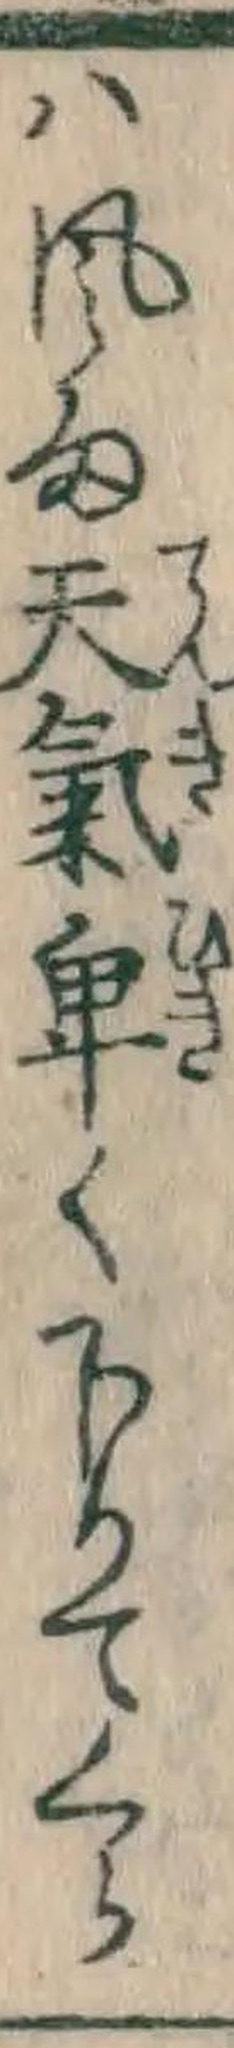は風雨天気卑く下りてくら
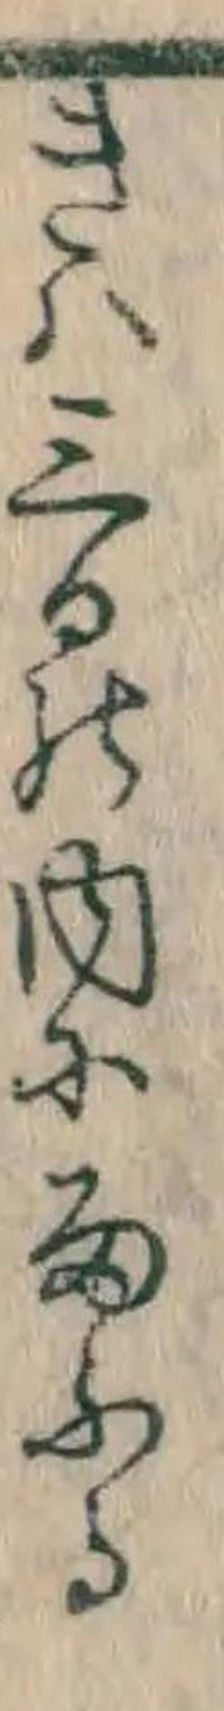きは三日の内に雨ふる
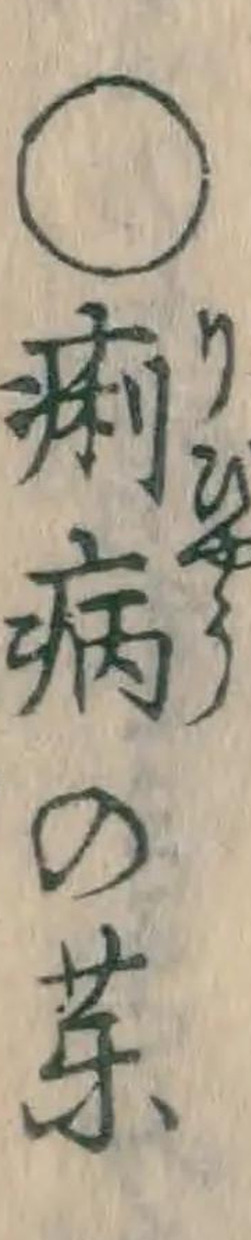○痢病の薬
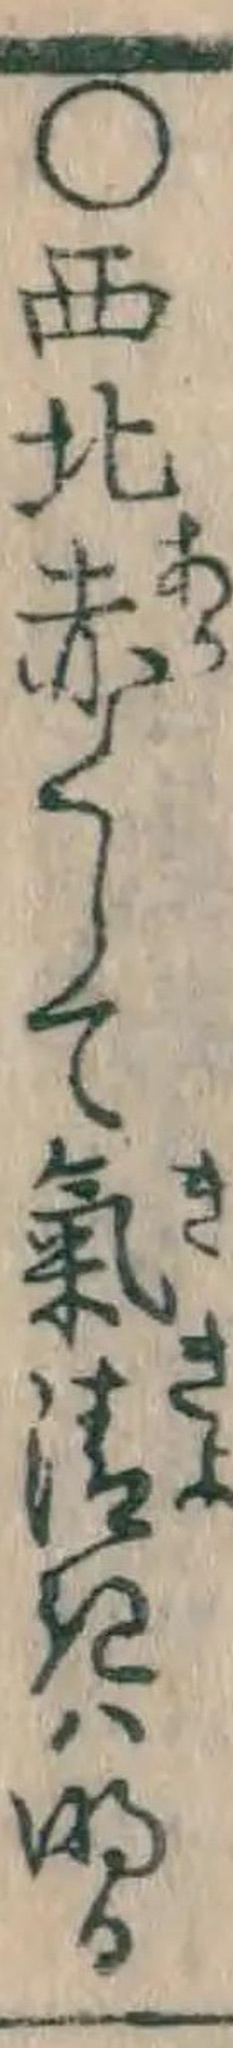○西北赤くして気清きは明日
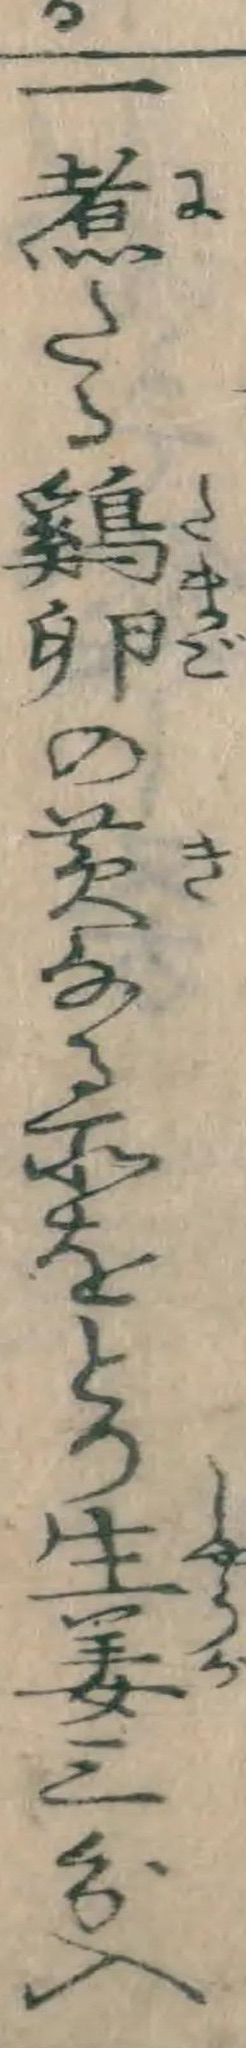一煮たる鶏卵の黄なる所をとり生姜三分入

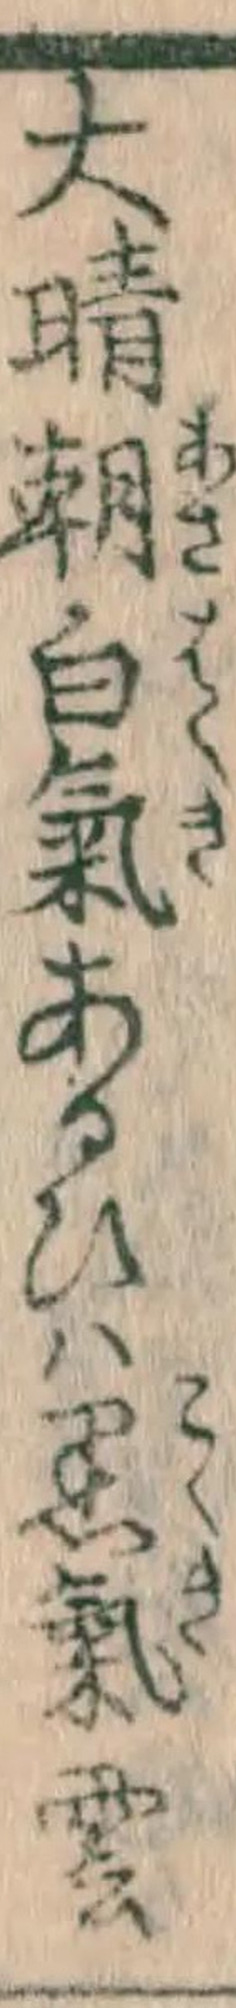大晴朝白気あるひは黒気雲
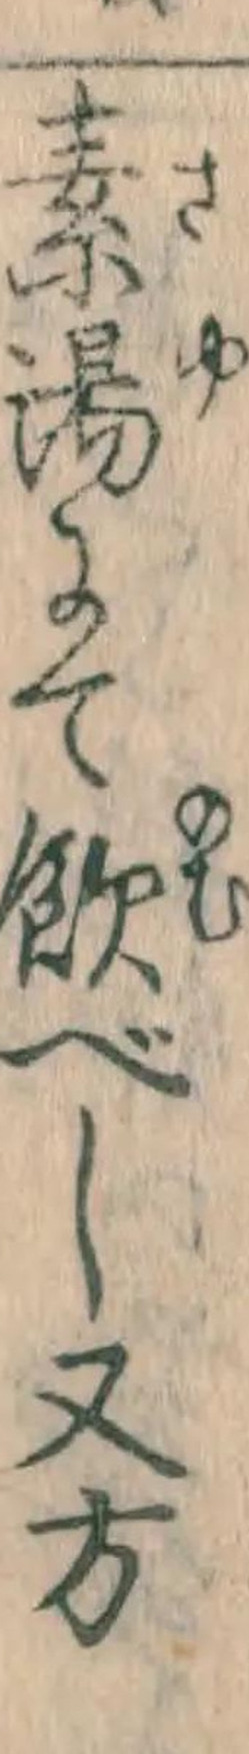素湯にて飲べし又方
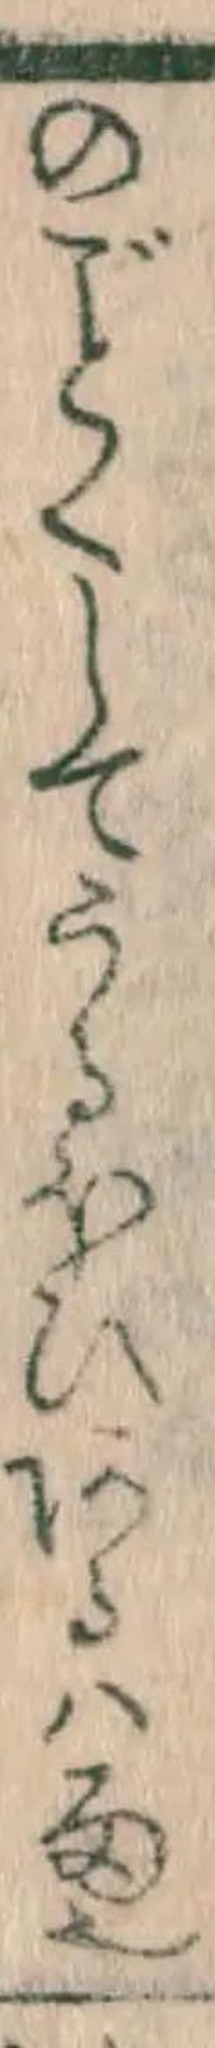のごとくしてうるほひあるは雨也
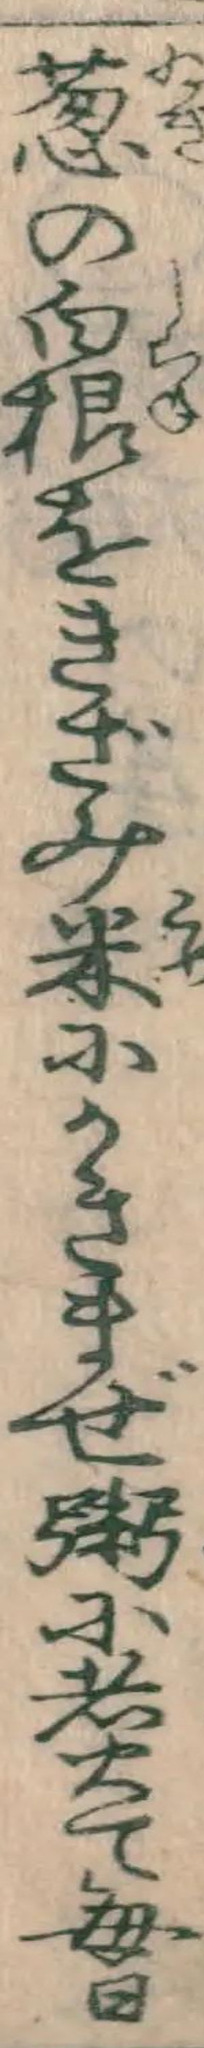葱の白根をきざみ米にかきまぜ粥に煮て毎日
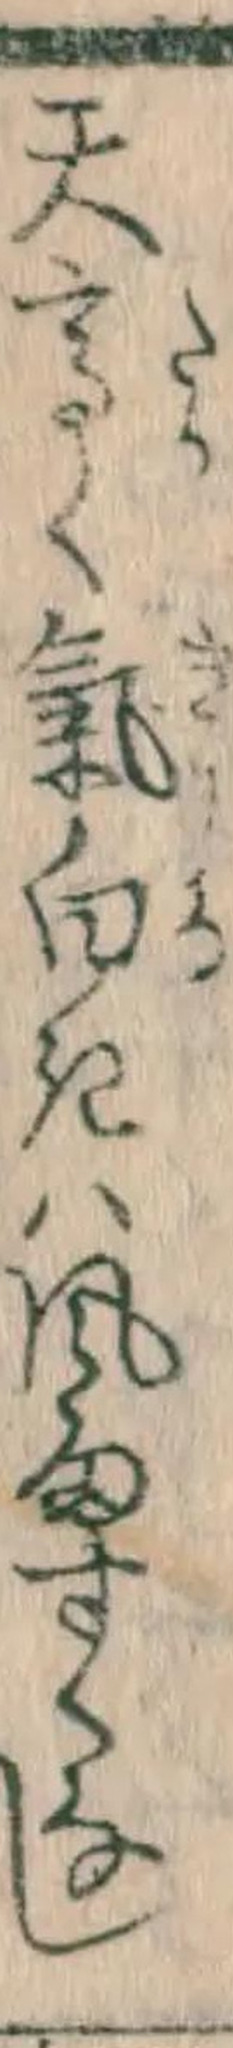天高く気白きは風雨すくなし
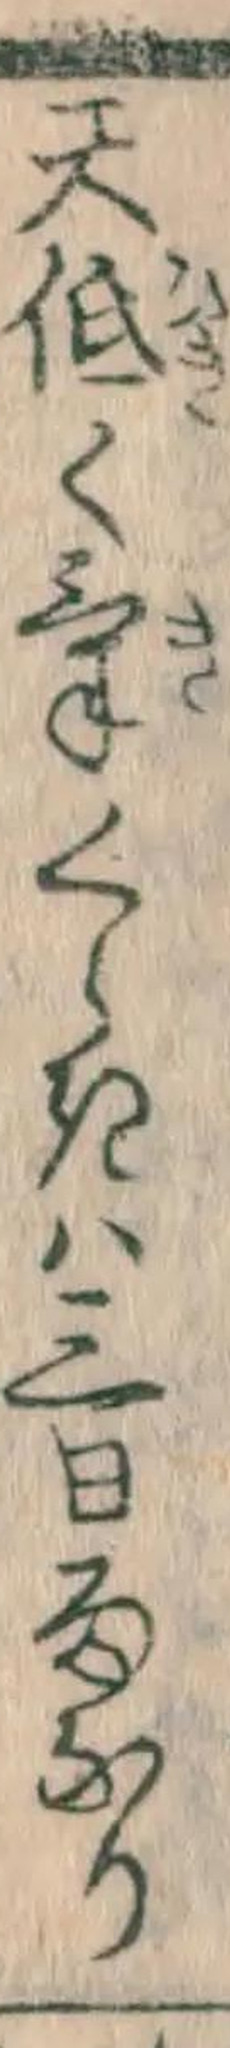天低く気くらきは三日雨なり
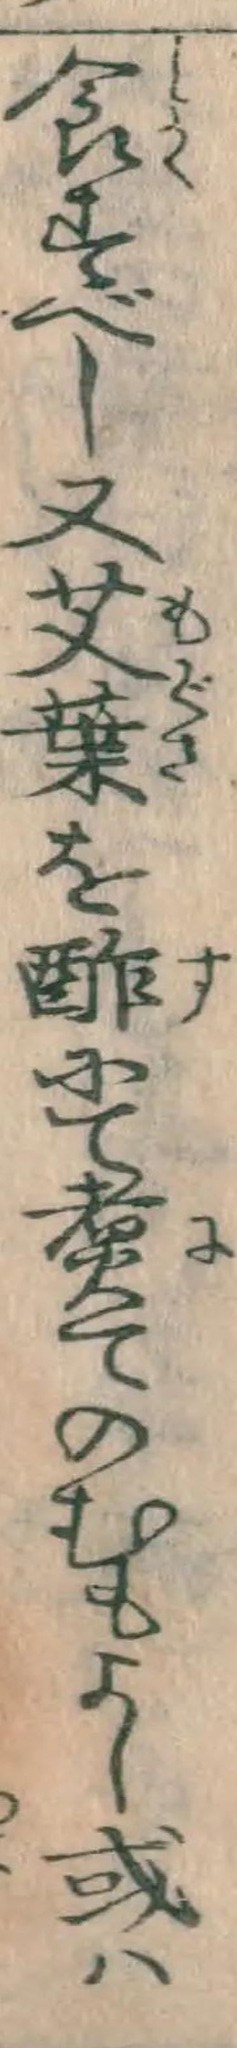食すべし又艾葉を酢にて煮てのむもよし或は
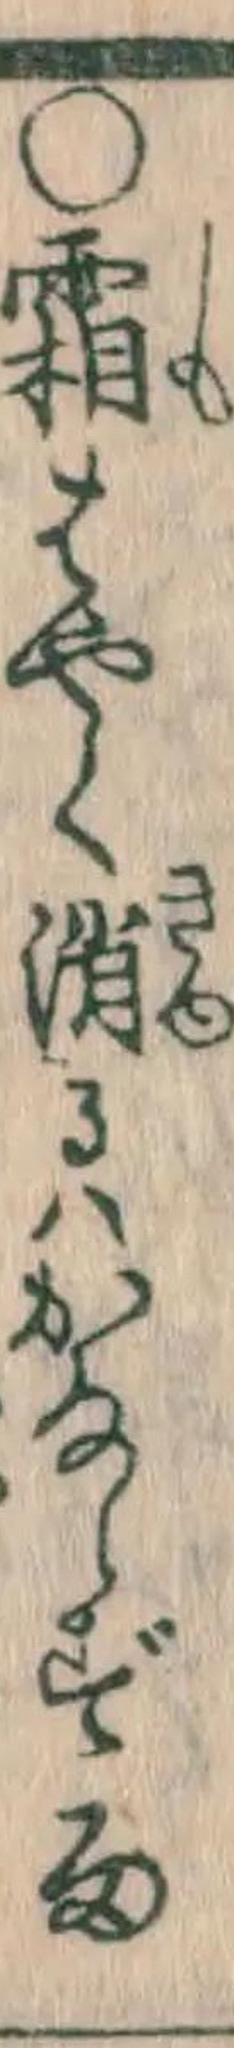○霜はやく消るはかならず雨
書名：広益秘事大全 3巻. [4]
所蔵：国立国会図書館 National Diet Library, JAPAN
